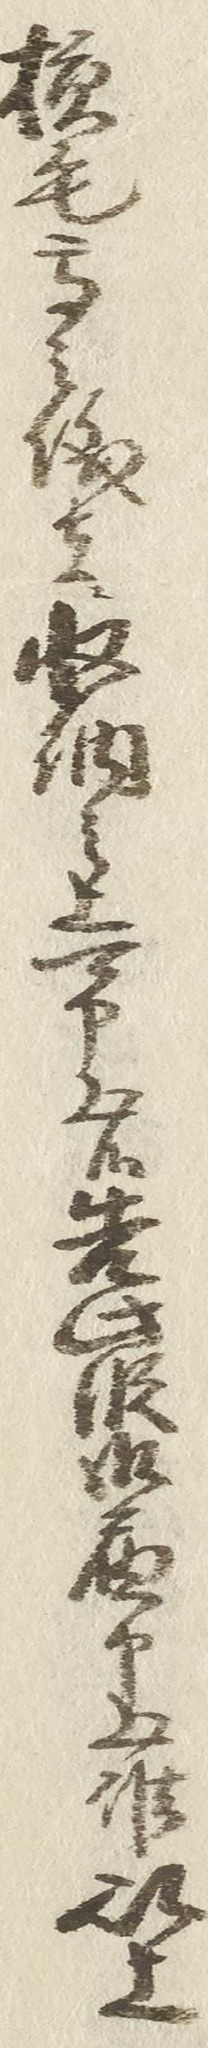損毛高之儀は収納之上可申上候先此段御届申上候以上
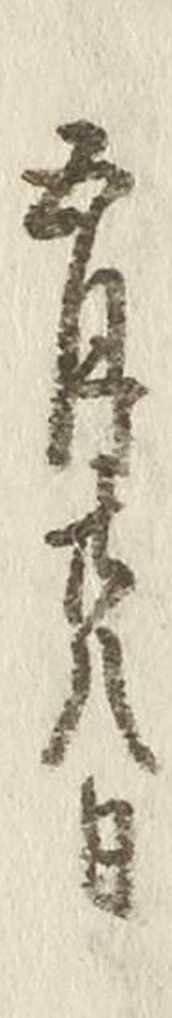五月廿八日
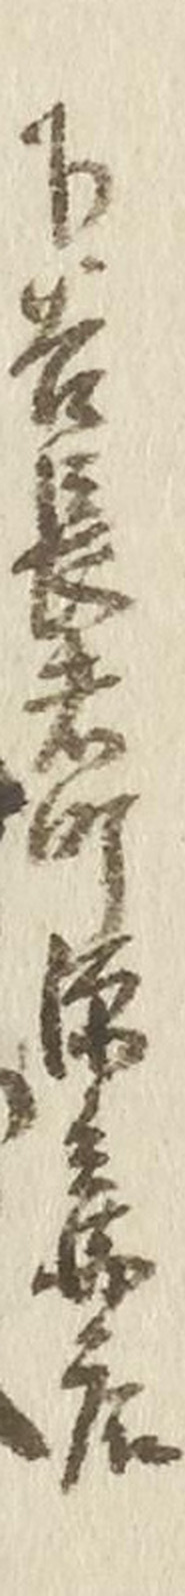下谷長者町源兵衛店
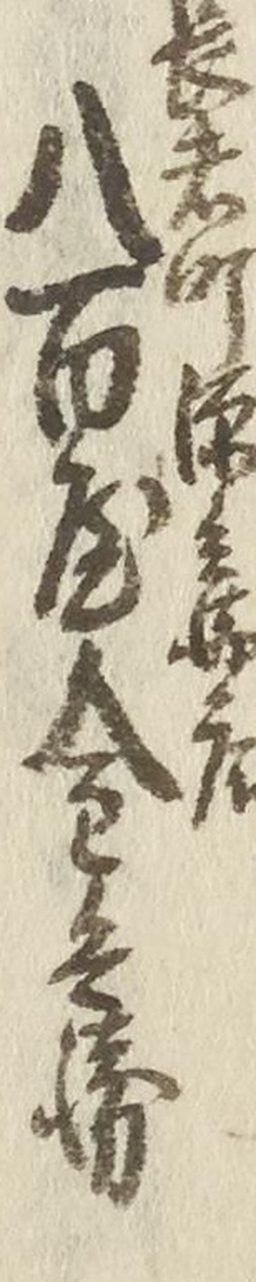八百屋金兵衛
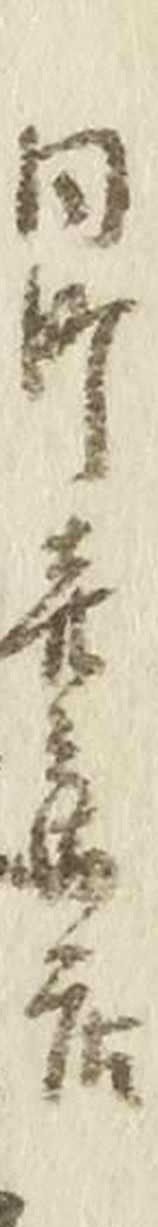同町喜兵衛店
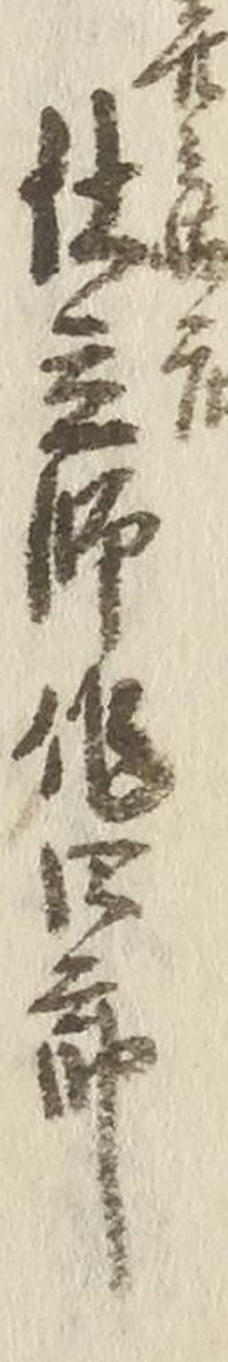仕立師作四郎
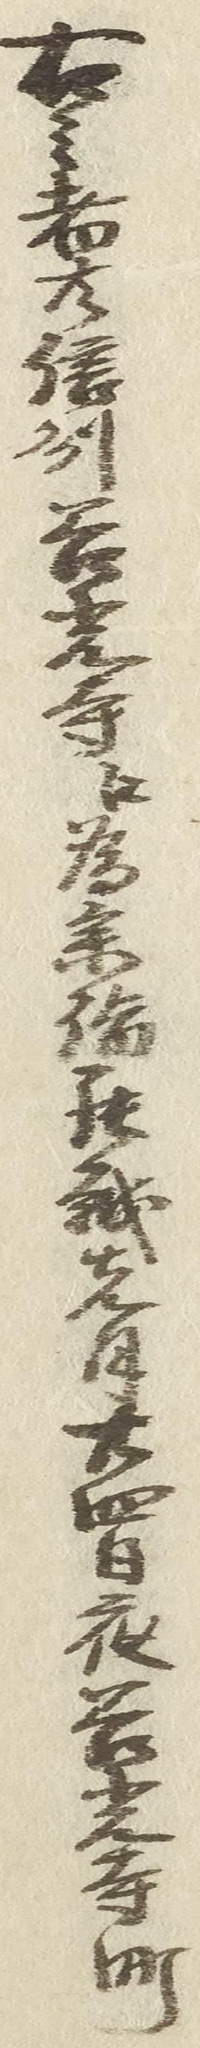右之者共信州善光寺江為参詣罷越先月廿四日夜善光寺町

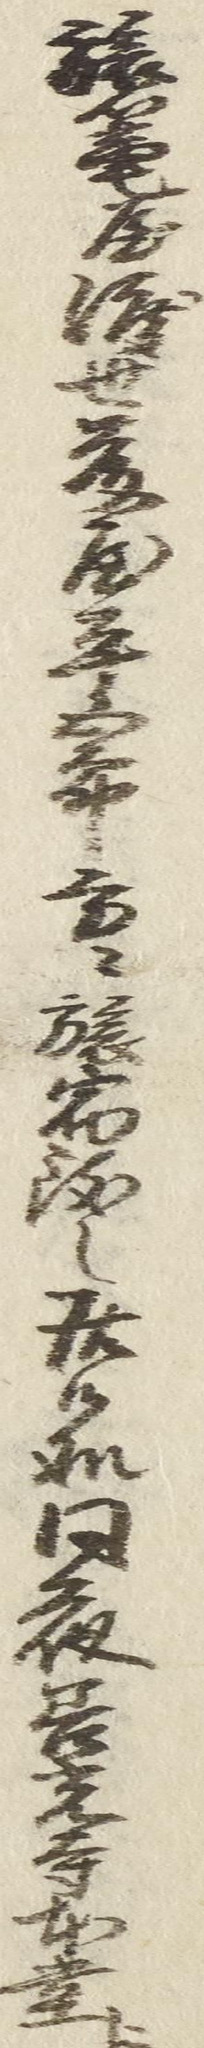旅籠屋渡世藤屋平五郎方ニ旅宿致し居候処同夜善光寺本堂江
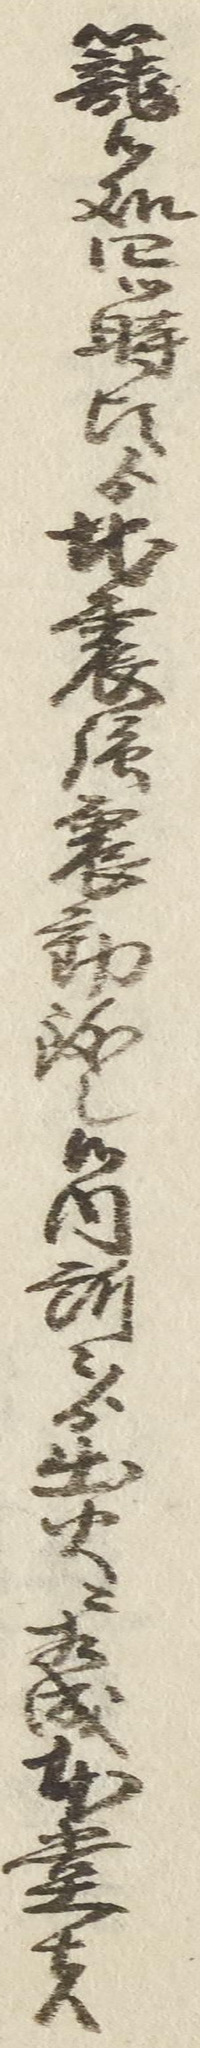籠候処四ツ時頃ゟ地震強震動致し候内所々ゟ出火ニ相成本堂は
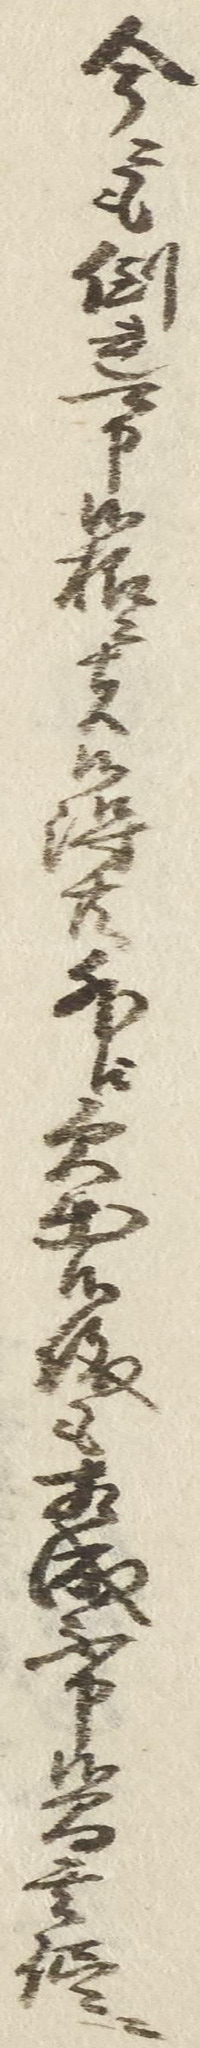今ニも倒れ可申候様ニは候得共外江欠出候儀も相成不申候間其侭ニ
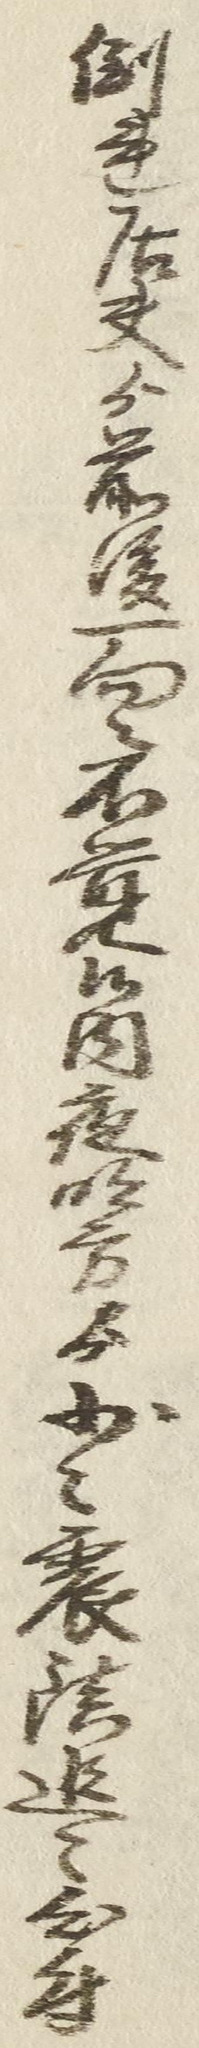倒れ居夫ゟ前後一向ニ不覚候内夜明方ゟ少々震鎮追々心付
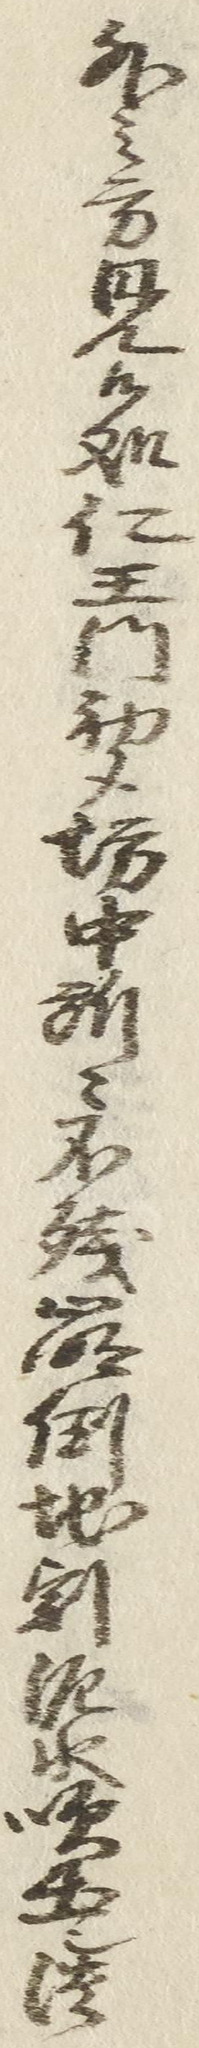外之方見候処仁王門初メ坊中所々不残崩倒地割泥水吹出シ潰
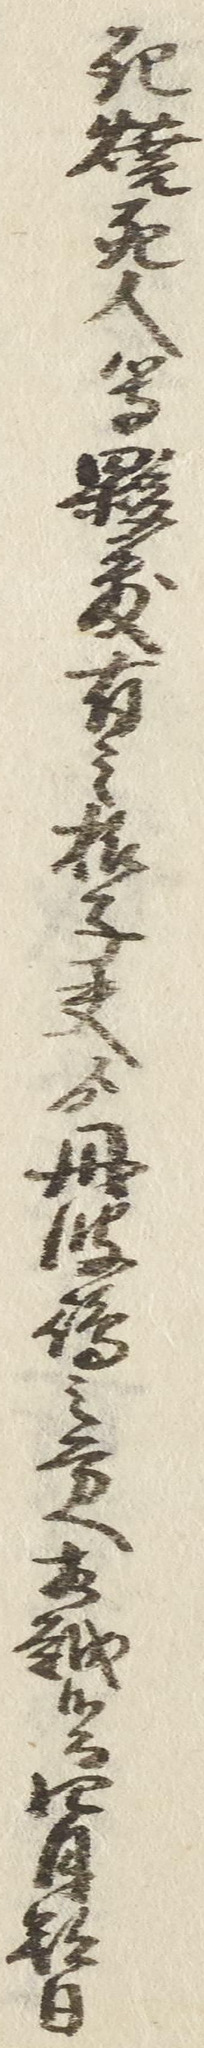死焼死人等夥敷有之様子夫ゟ丹波嶋之方へ相越候而四月朔日
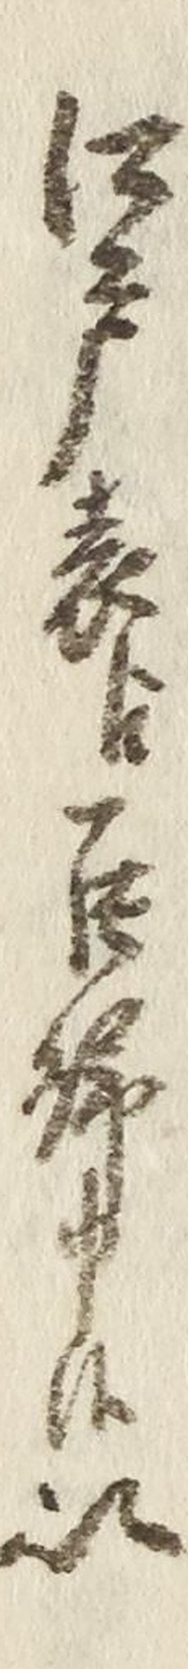江戸表江罷帰申候以
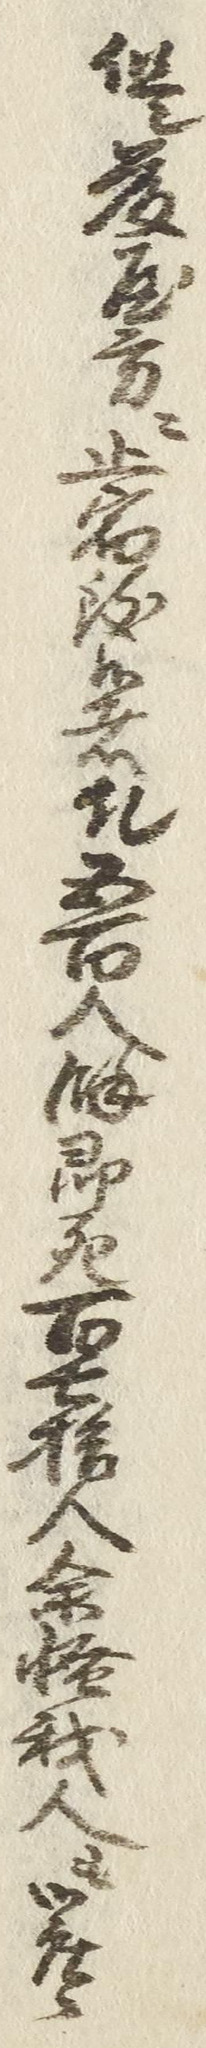但シ藤屋方ニ止宿致候者凡五百人余即死百七拾人余怪我人も御座候
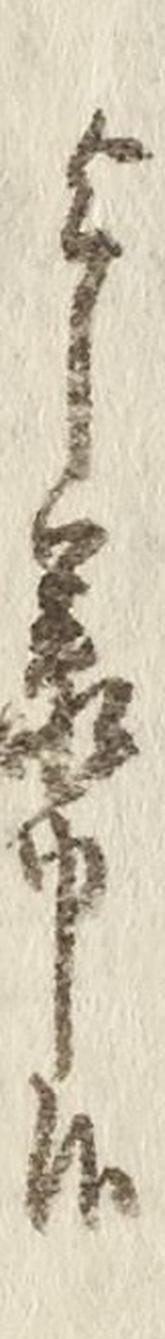よし承申候
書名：従往古地震御届書記誌之一
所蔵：東京大学地震研究所図書室 Earthquake Research Institute Library, The University of Tokyo, JAPAN
